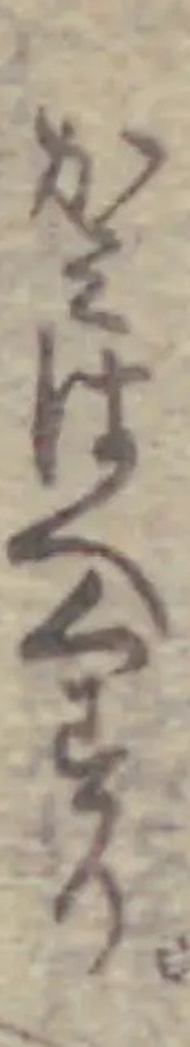かみはへくすり
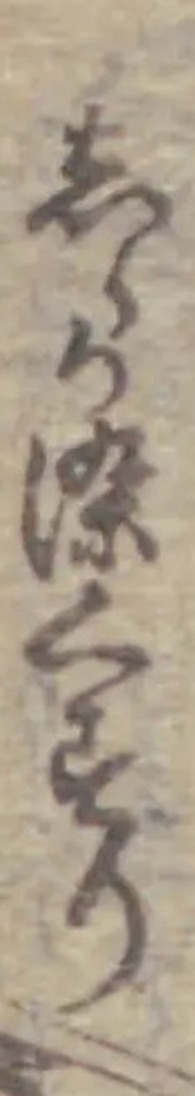しらか染くすり
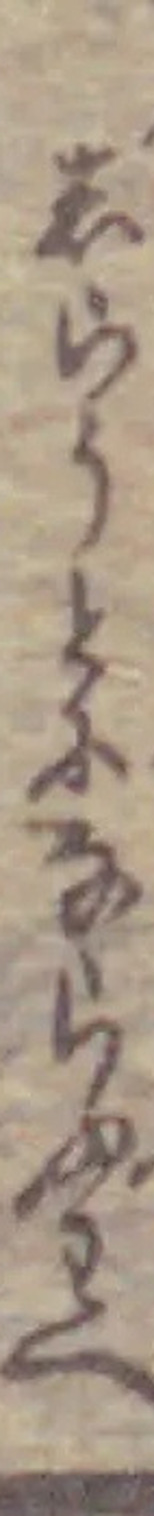しらうとにならふわへ

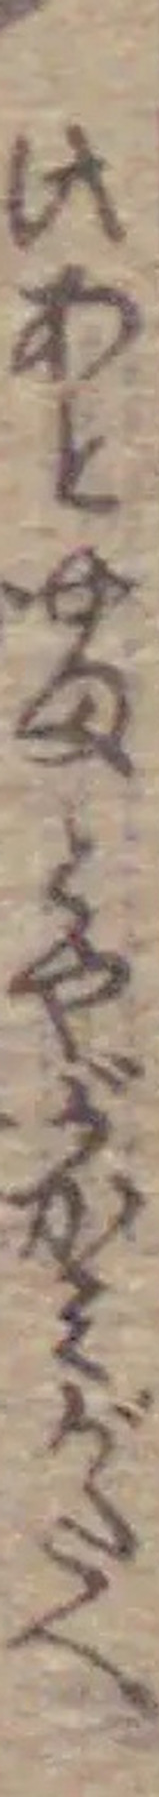此あとやまとやがかみがたへ
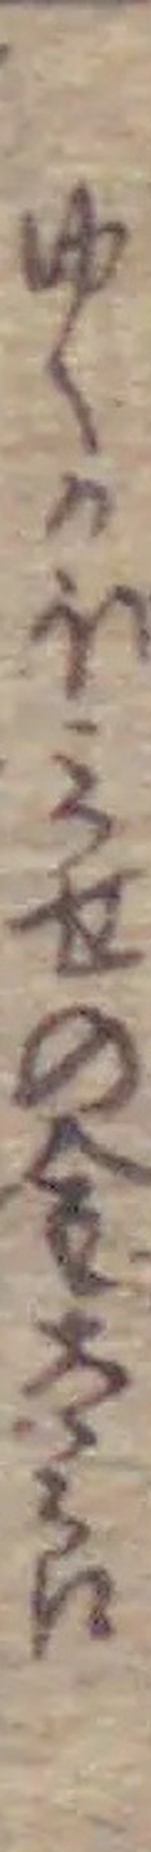ゆくかほみせの金太郎に
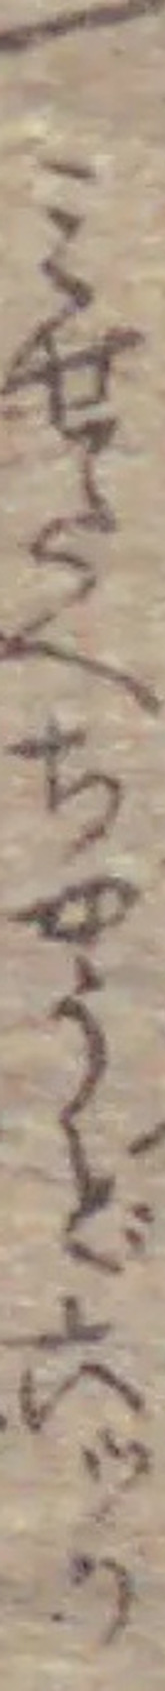みせたへちやうど六つか
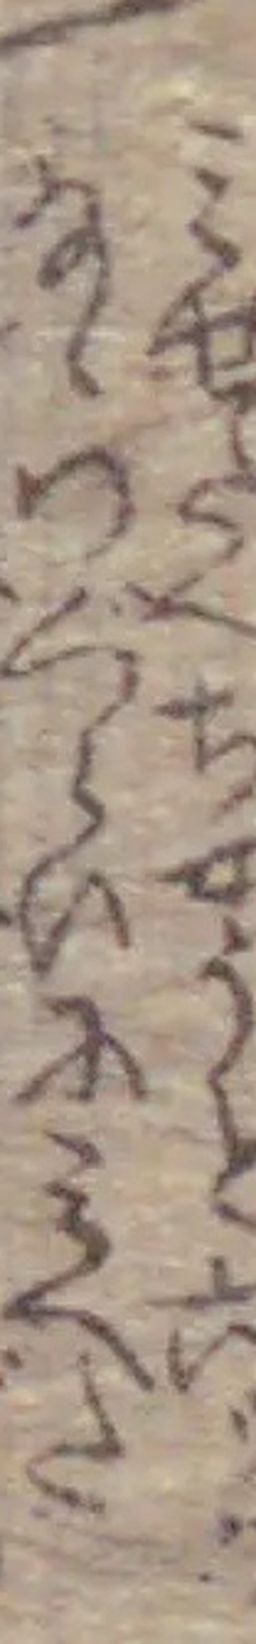なゝつくらいにみへた
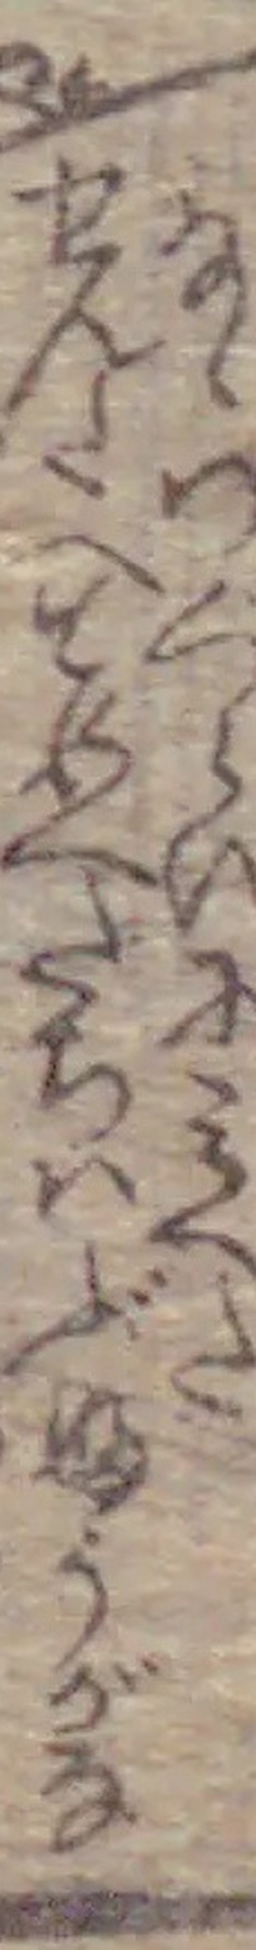せんたへてめへたちはぶふうがな
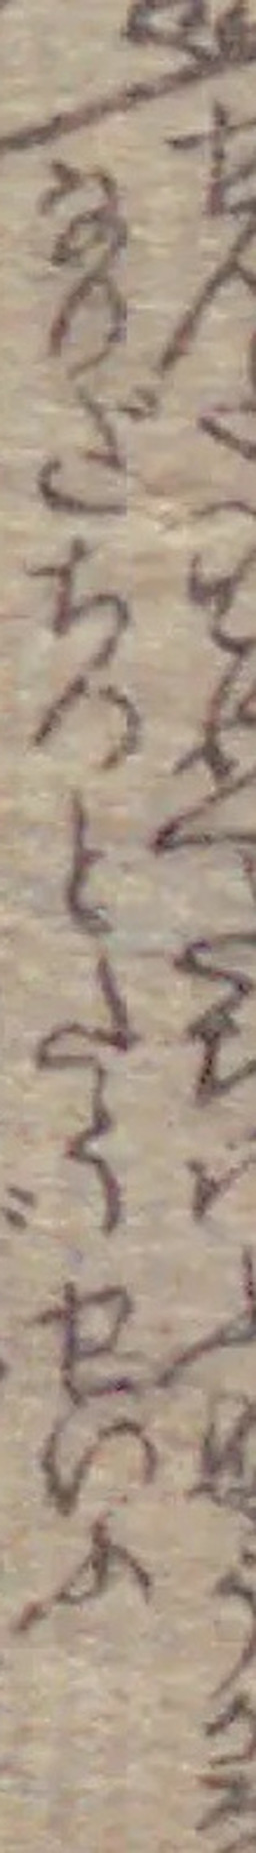なりだちつとたうせいに
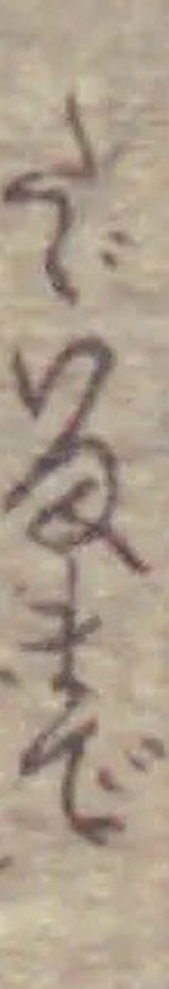たゞいままで
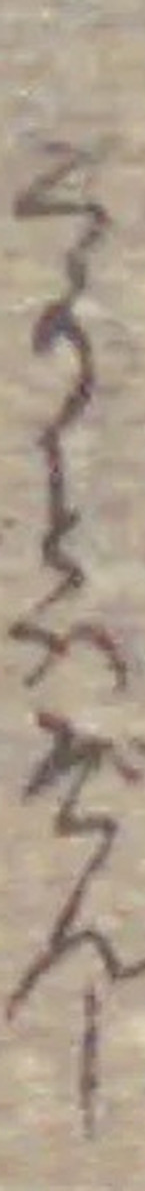こうとはぞんし
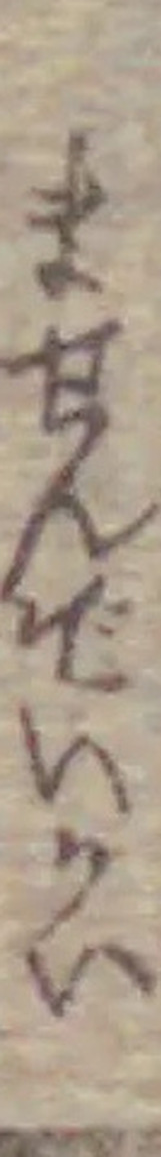ませんでいかい
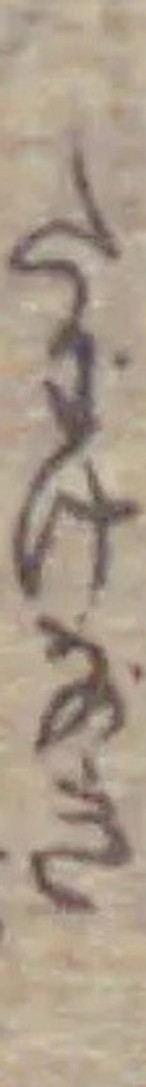たわけなき
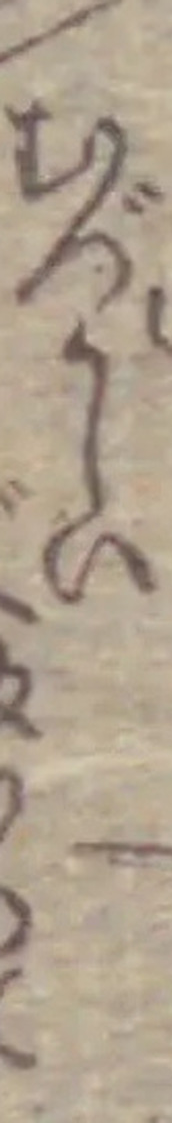むづかしい
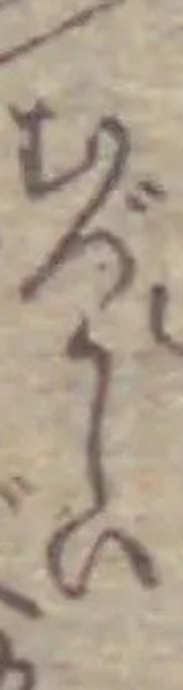むづかしい
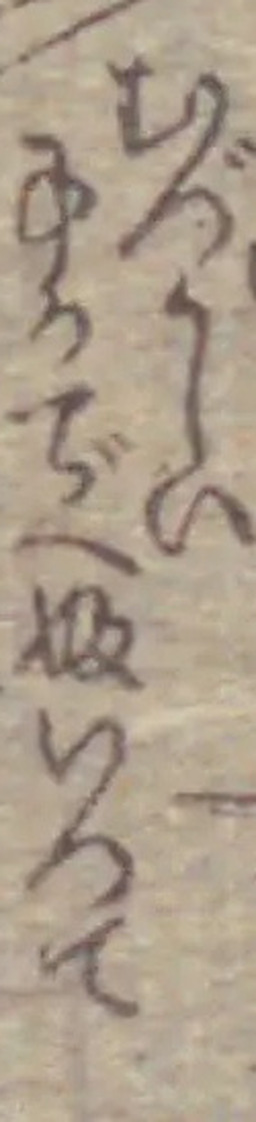事かでへふいつて
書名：化物大閉口 2巻
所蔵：国立国会図書館 National Diet Library, JAPAN
